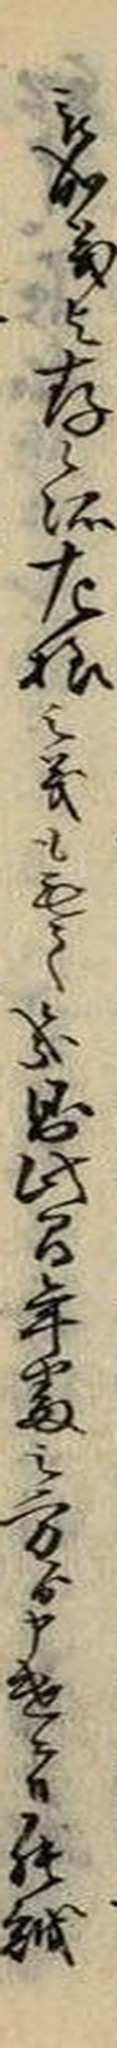被成義と存候所左様之義も無之候哉則此間年番之方ゟ申遣に付罷越
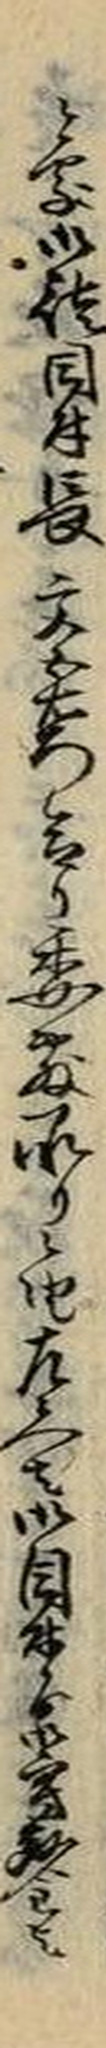候処御徒目付長文五右衛門参り委敷承り候由左候へは御目付ゟ御穿鑿と
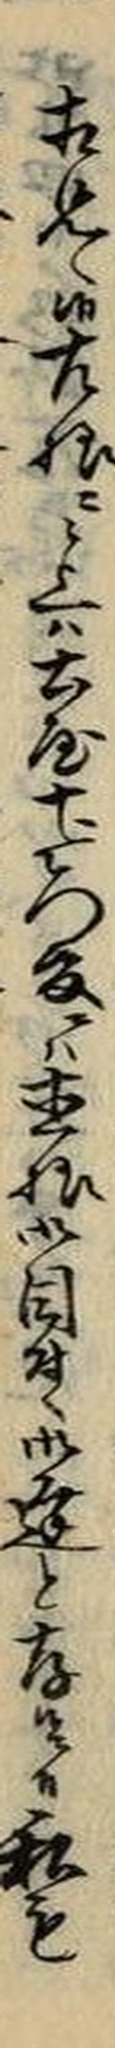相見へ候左様に候上は土屋十郎右衛門殿には直様御目付へ御達と存候に付私も
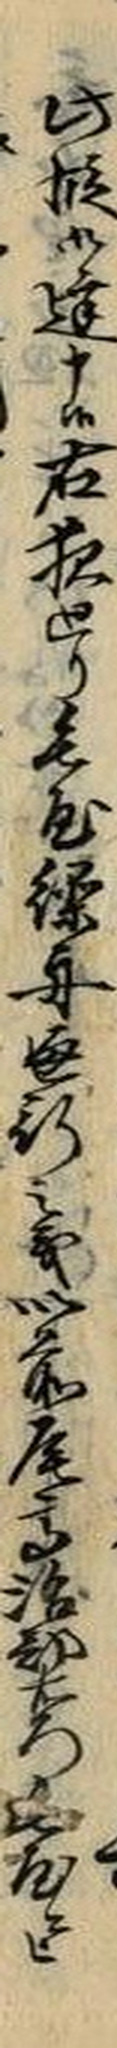此段御達申候右夜廻り毛屋繰舟通行之義以前尾高治部右衛門毛屋に被
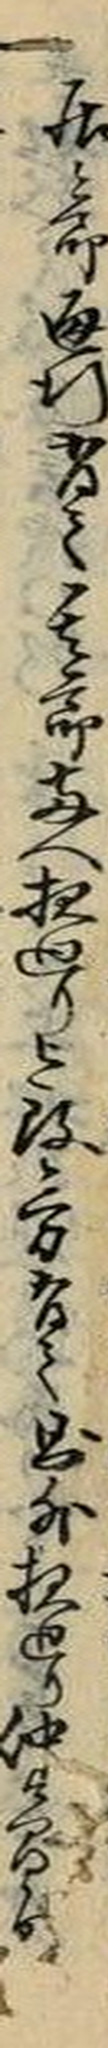居候節通行有之其節両人夜廻り被致候方有之則外夜廻り仲ケ間ゟ
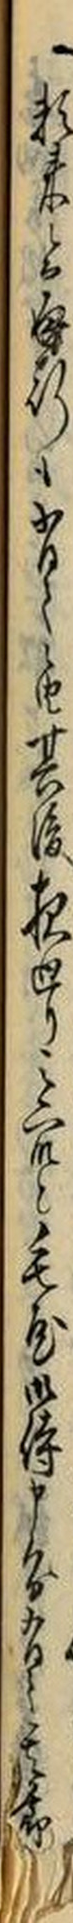頼来候て通行も有之候由其後夜廻り之衆と毛屋御侍申分有之其節
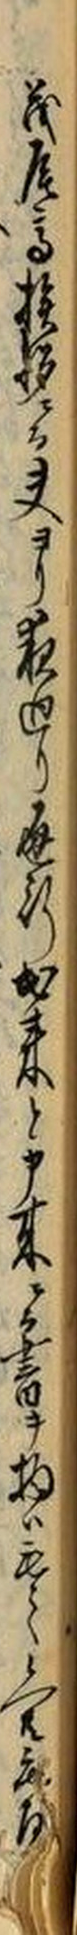も尾高挨拶にて夫ヨリ夜廻り通行出来と申来にて書キ物は無之候へ共毛屋
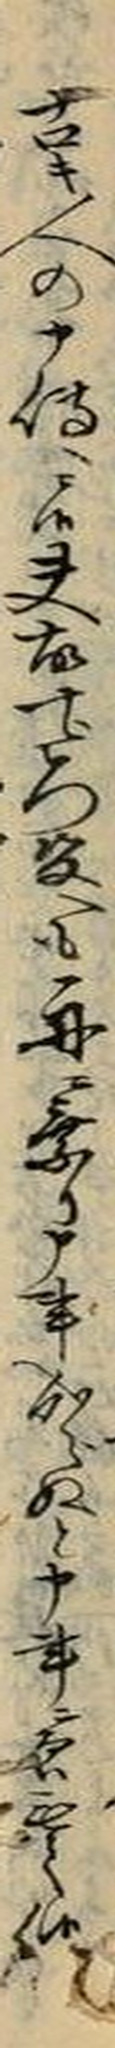古キ人の申伝へに候夫故十郎右衛門殿へも舟に乗り申事成らぬと申事にては無之候
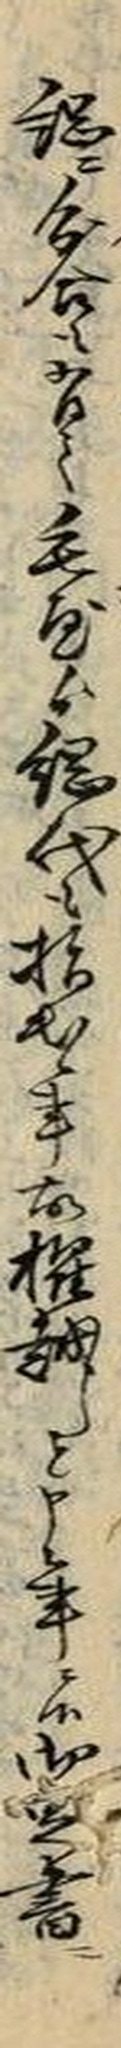綱に分合も有之毛屋ゟ綱代も指出候事故櫂越しと申候事に候御定書に
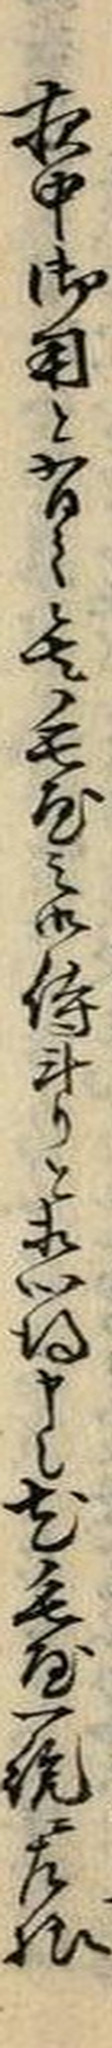夜中御用と有之候は毛屋之御侍斗りと相心得申候尤毛屋一統に左様
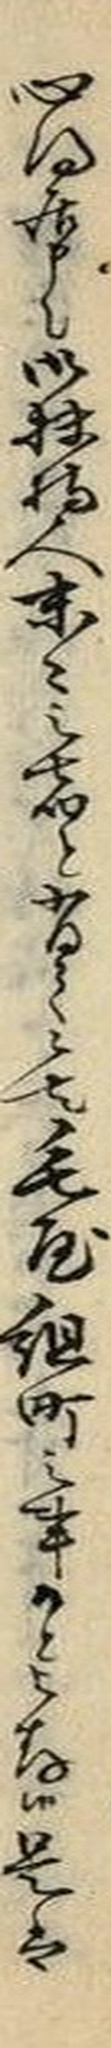心得居申候御扶持人末々之者と有之には毛屋組町之事かと被存候是は
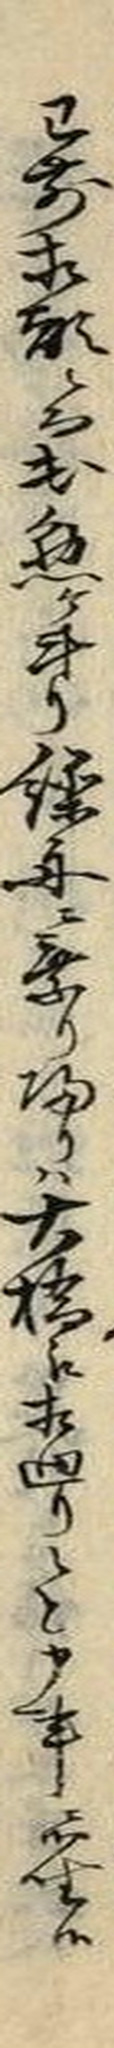已前相願候て出懸ケ斗り繰舟に乗り帰りは大橋え相廻り候と申事に御坐候
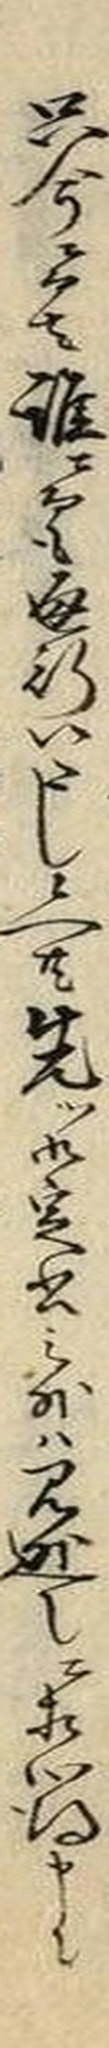只今にては誰にても通行いたし候へ共先ツ御定書之外は見逃しに相心得申候
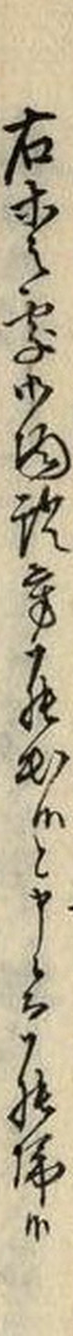右等之処御内証旁罷出候と申候て罷帰候
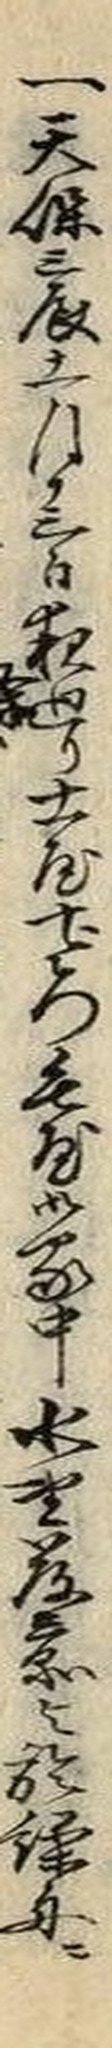一天保三辰十一月三日夜廻り土屋十郎右衛門毛屋御家中水野藤兵衛と於繰舟に
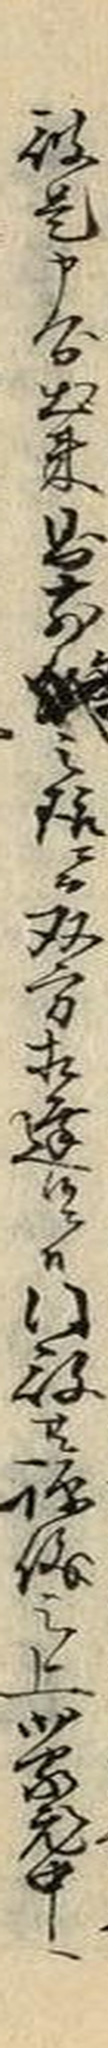彼是申分出来則前条之趣にて双方相達候に付同役共評儀之上御家老中へ
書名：御城下諸事之部
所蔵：福井県文書館 Fukui Prefectural Archives
